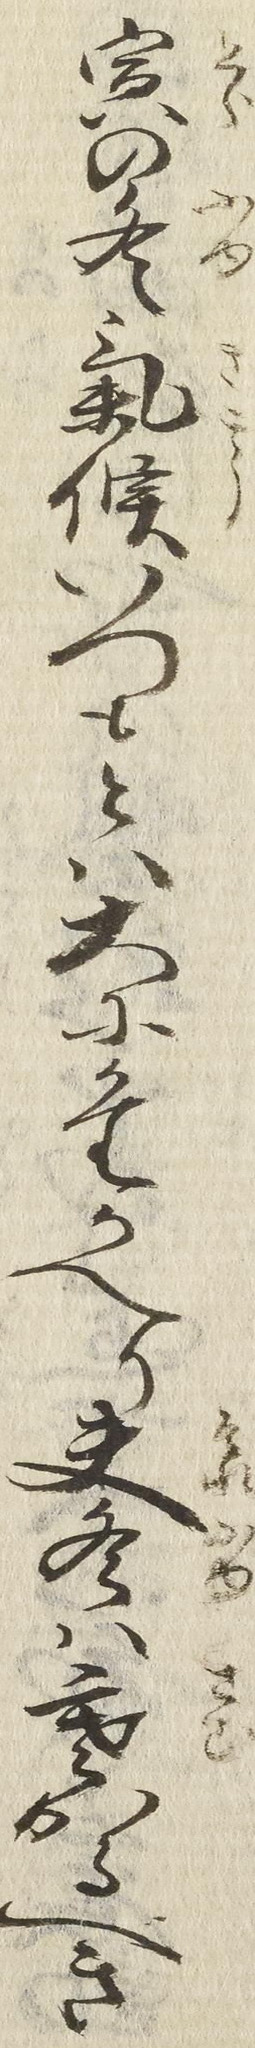寅の冬気候いつもとは大にたかへり夫冬は寒かるべき
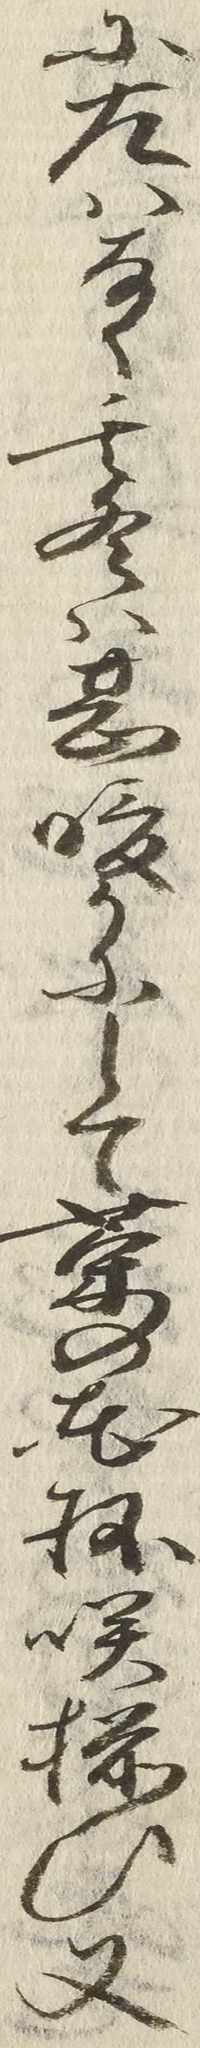に左はなく其冬は甚暖かにして菜の花抔咲揃ひ又
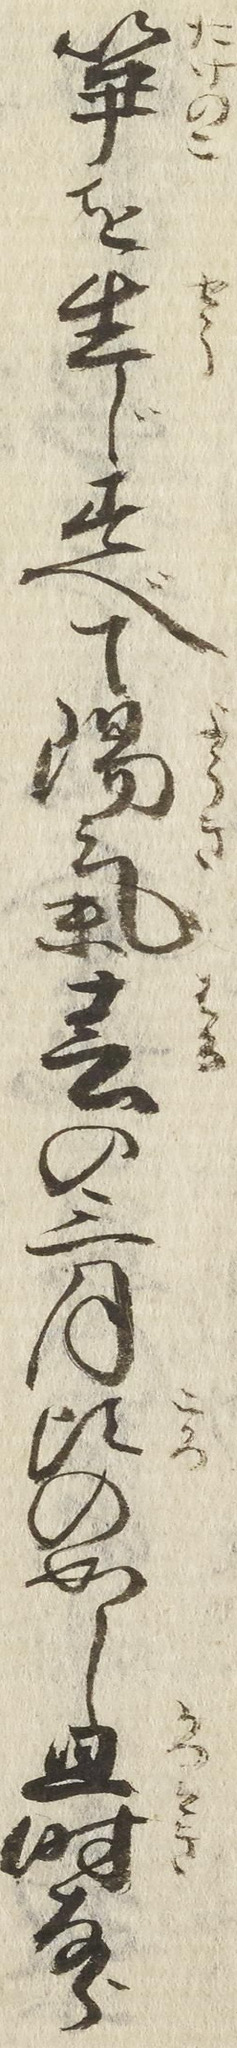笋を生じすべて陽気春の三月頃の如し且時なら
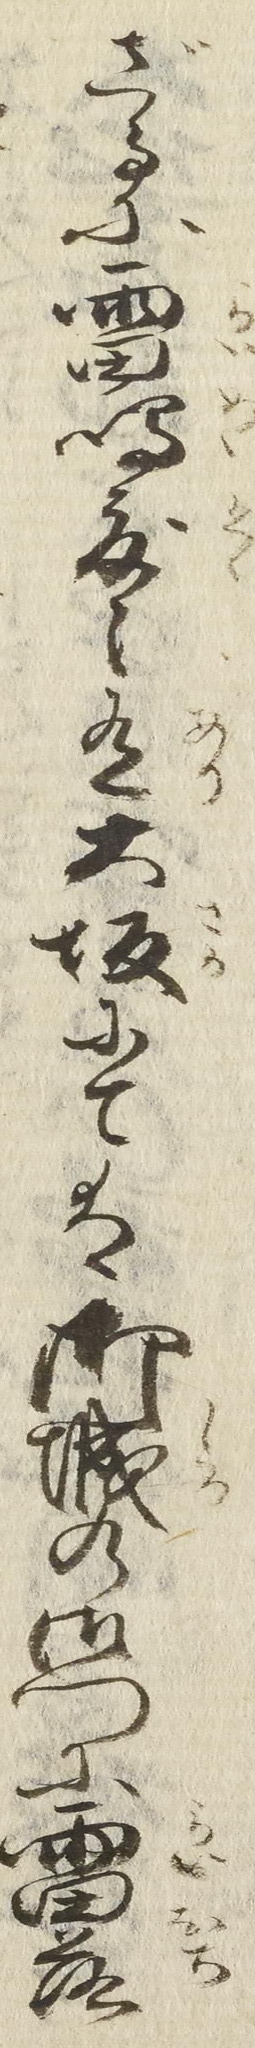ざるに雷鳴度〻有大坂にては御城の御門に雷落
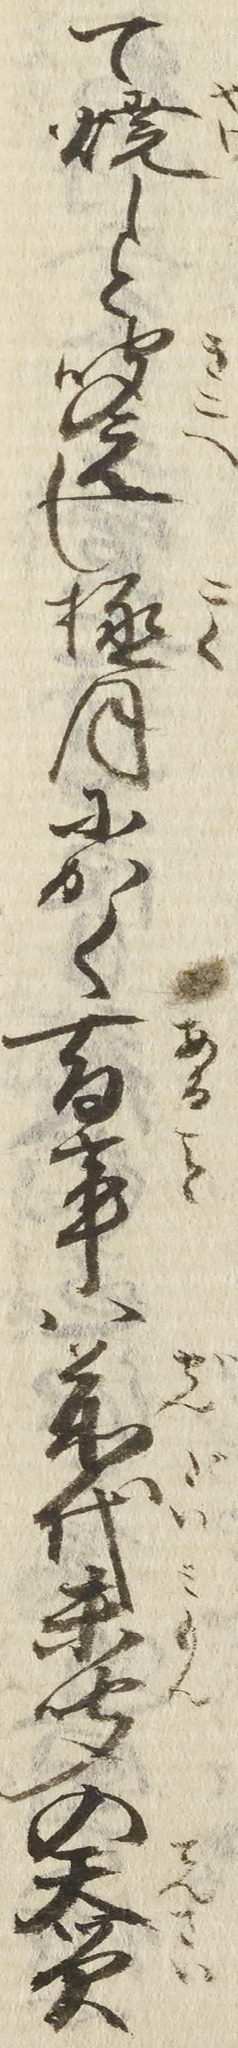て焼しと聞えし極月にかく有事は前代未聞の天災
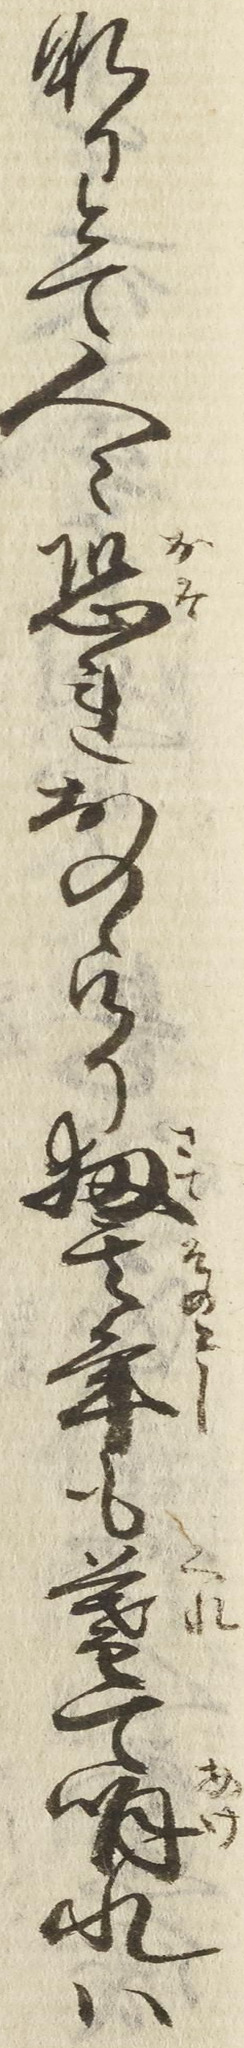なりとて人〻恐れおのゝけり扨其年も暮て明れは
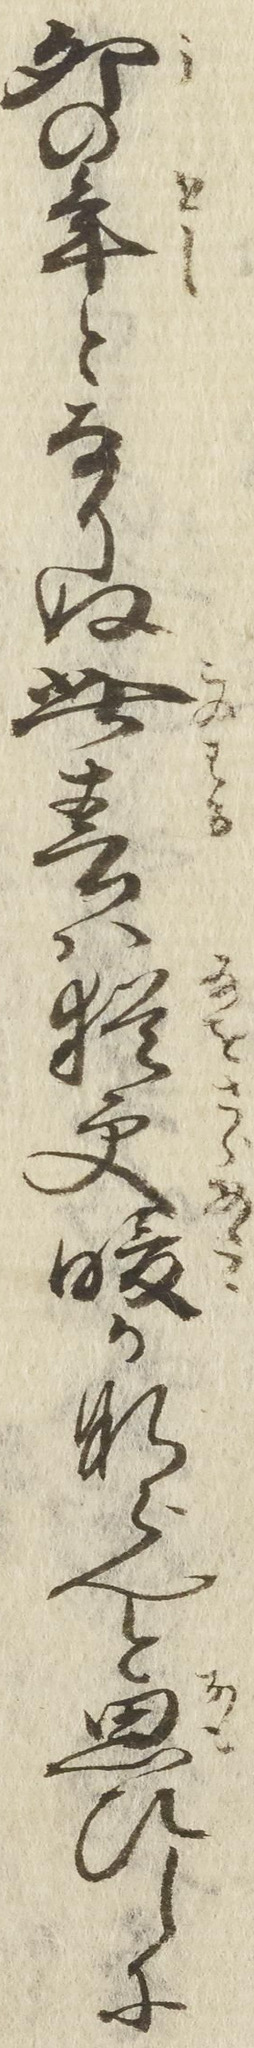卯の年となりぬ此春は猶更暖かならとの思ひしに
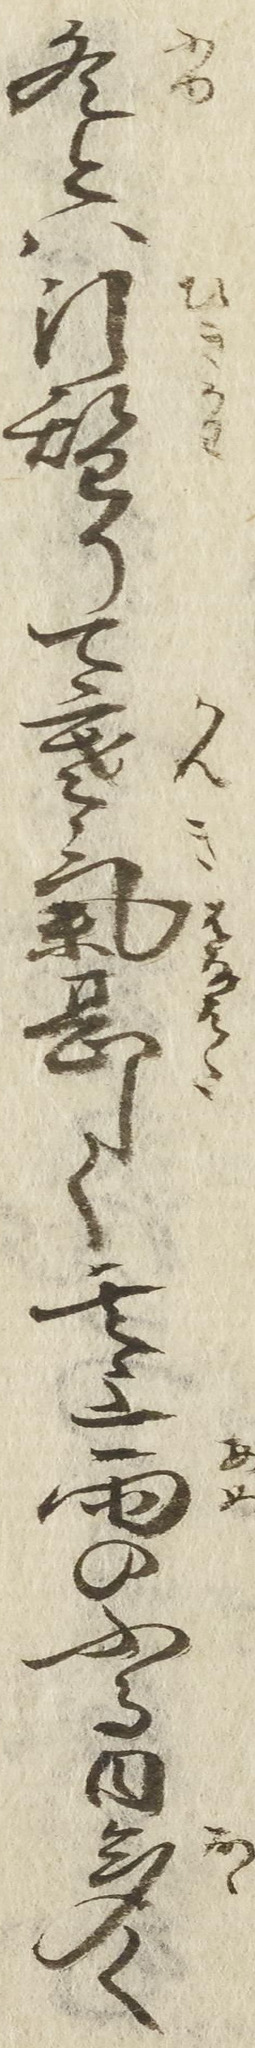冬とは引替りて寒気甚しく其上雨のふる日多く
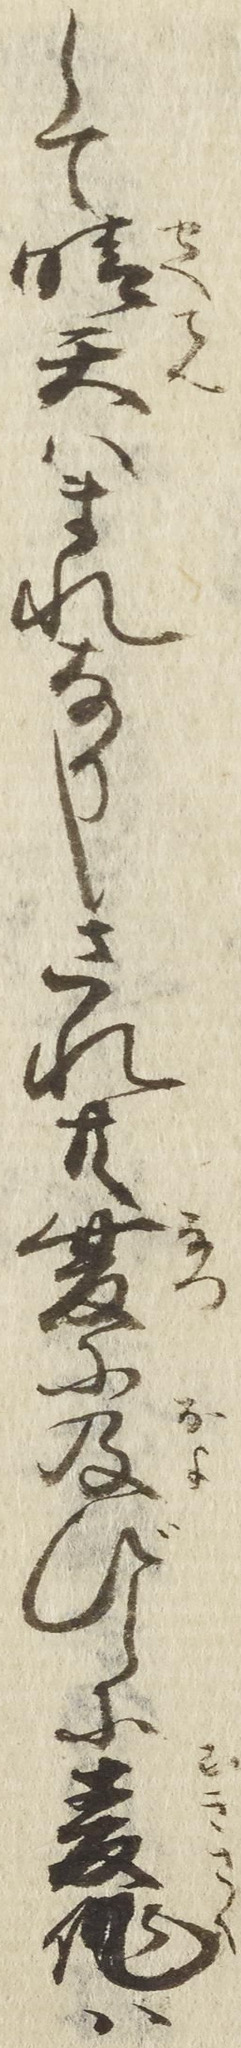して晴天はまれなりしされ共夏に及びしに麦作は
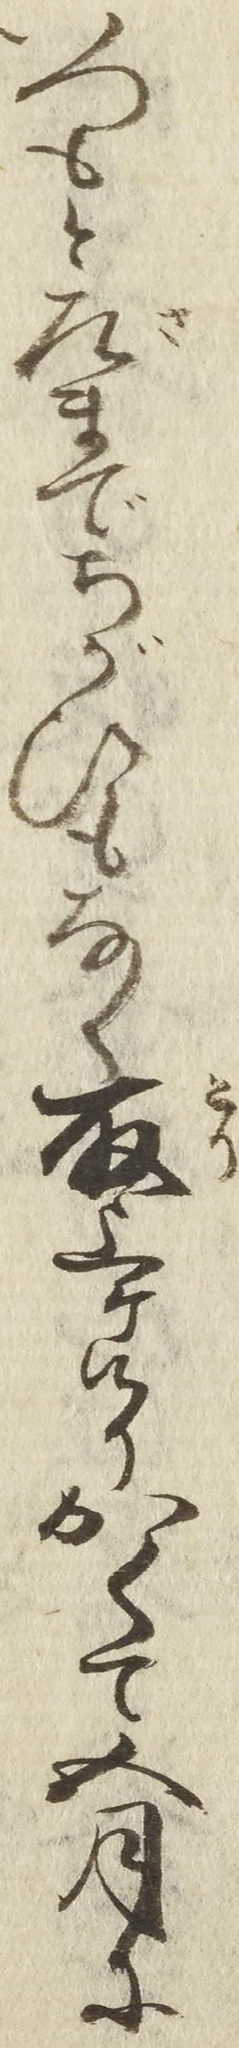いつもと左までちがひもなく取上ケけりかくて五月に
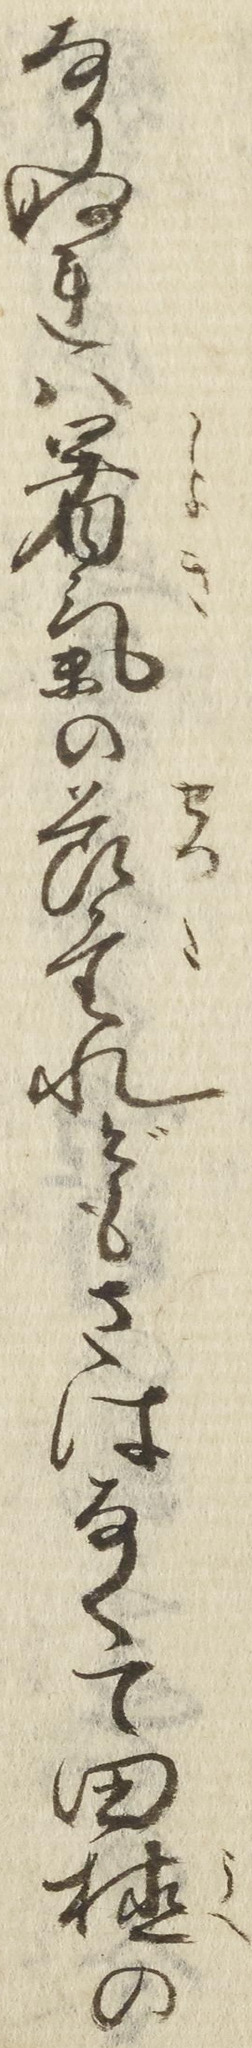なりぬれは暑気の節堂れどもさはなくて田植の
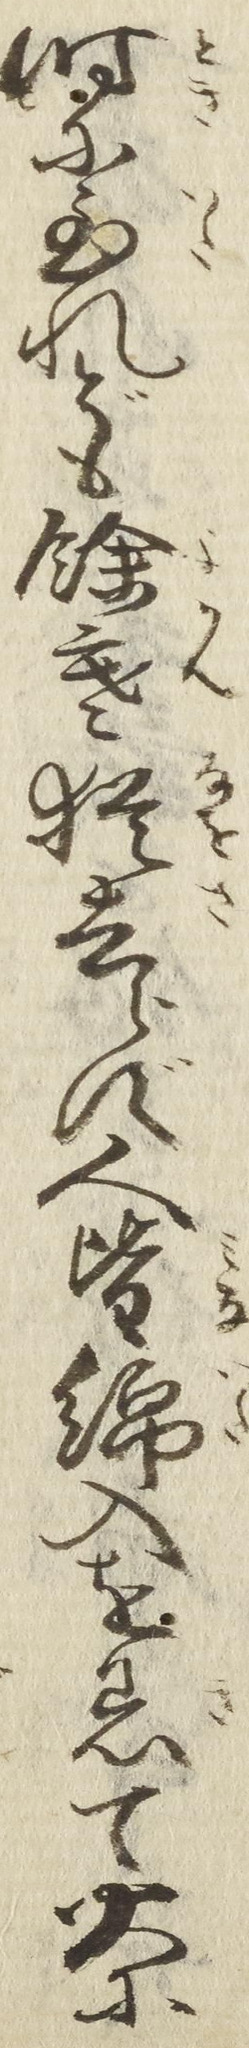時に至れども余寒猶去らず人皆綿入を着て火に
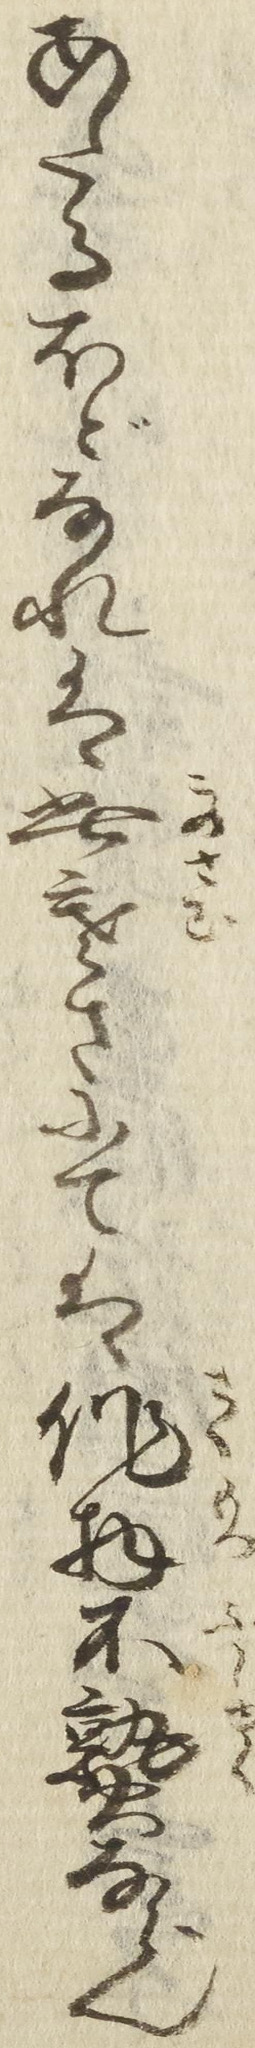あたるほどなれは此寒さにては作物不熟ならん

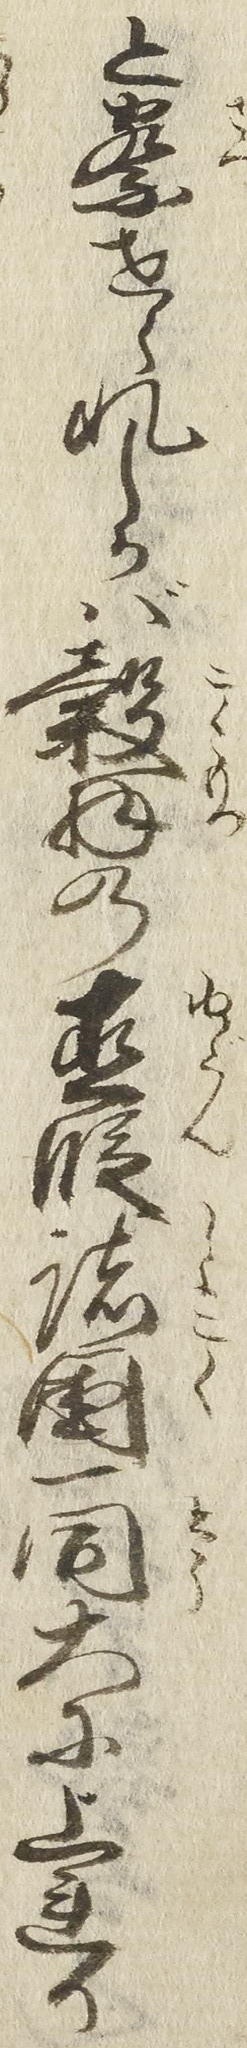と察せられしかば穀物の直段諸国一同大に上れり
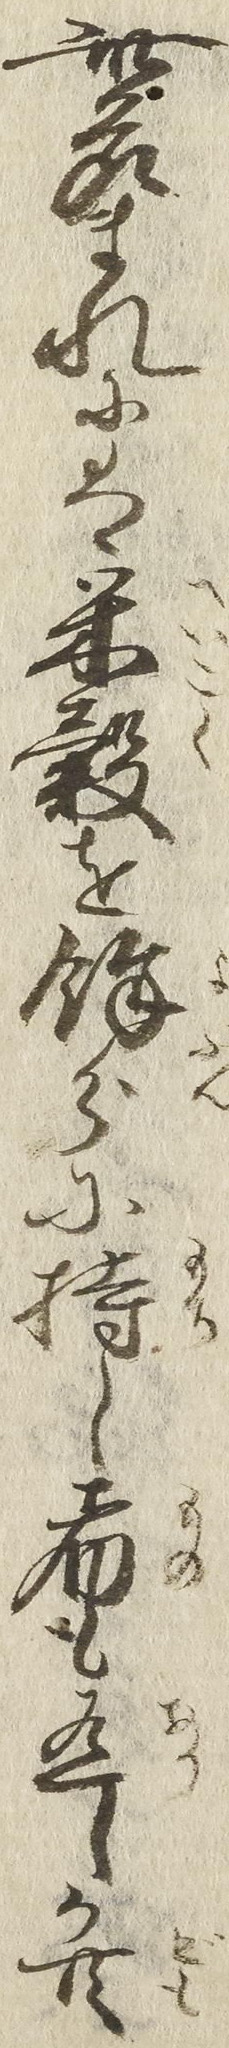此節まれには米穀を余分に持し者も有しか共
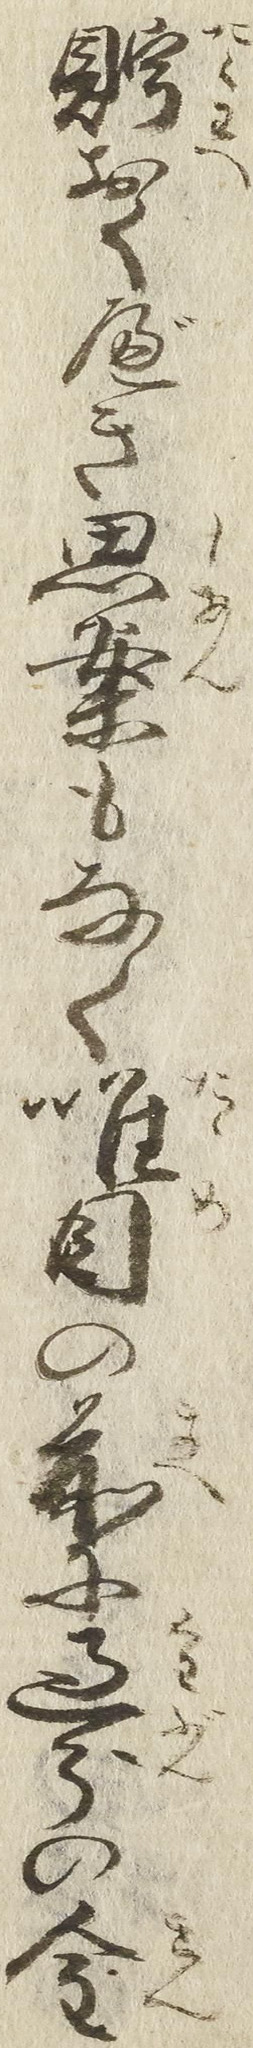貯おくべき思案もなく唯目の前に過分の金
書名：天明奇畧　全
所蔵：東京大学地震研究所図書室 Earthquake Research Institute Library, The University of Tokyo, JAPAN
